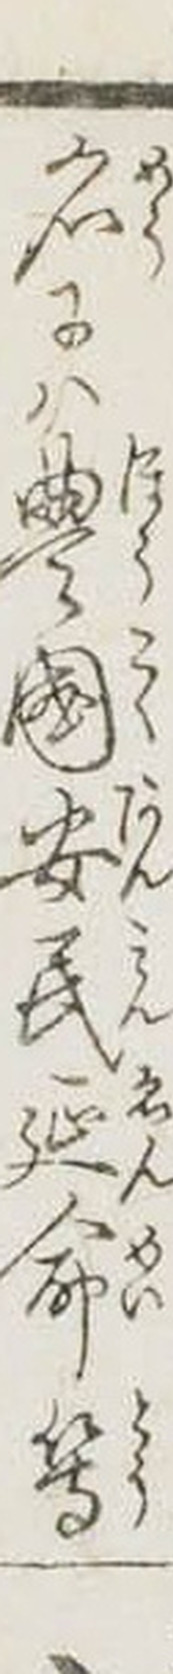名には豊国安民延命等
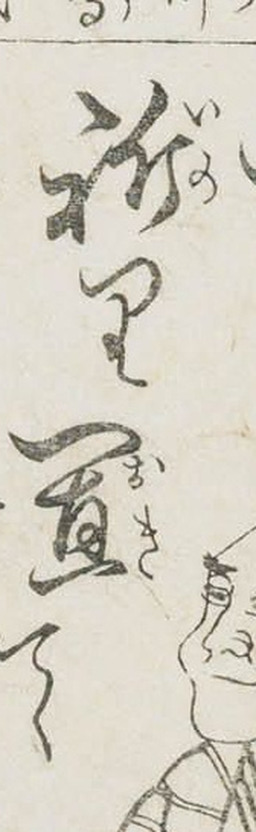祈り置て
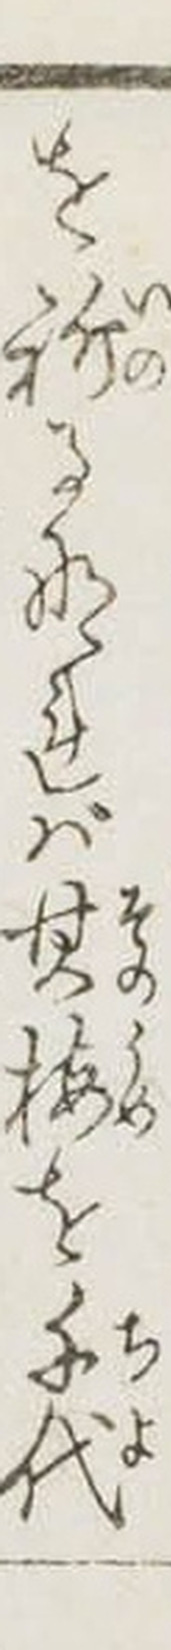を祈るなれば其梅を千代
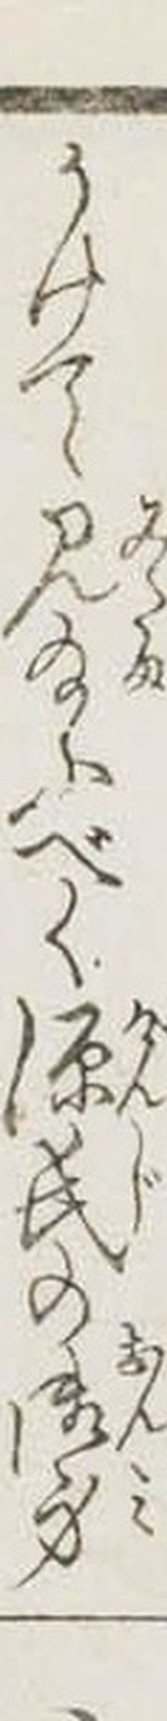かけて見給ふべく源氏の御身
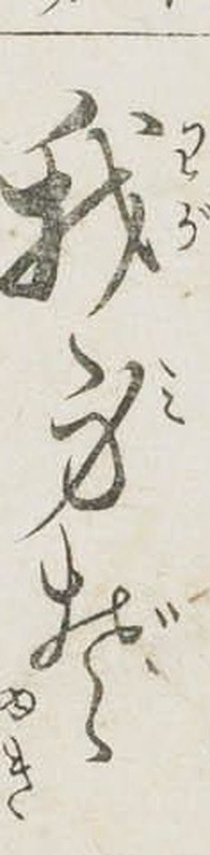我身ぞ
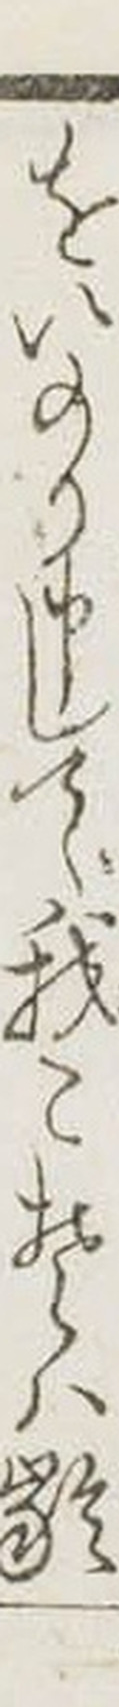をいのり申して我こそは齢
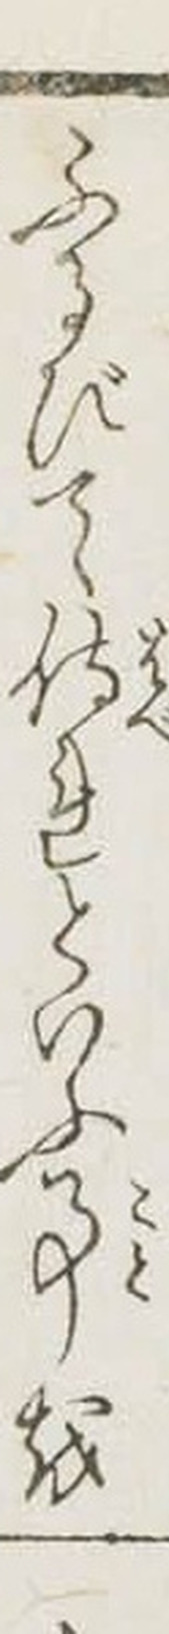ふるびて侍れといふ事を
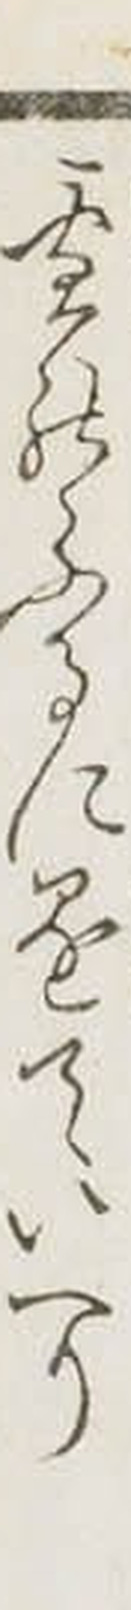雪のふるに懸ていへり
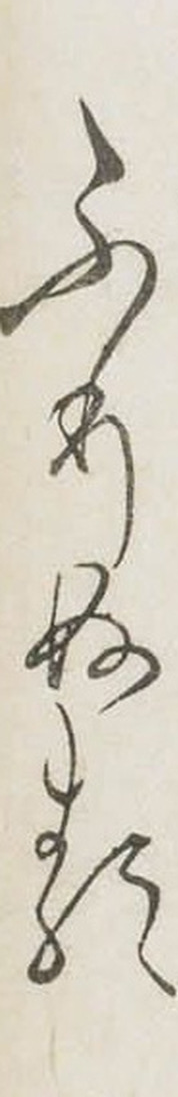ふりぬる
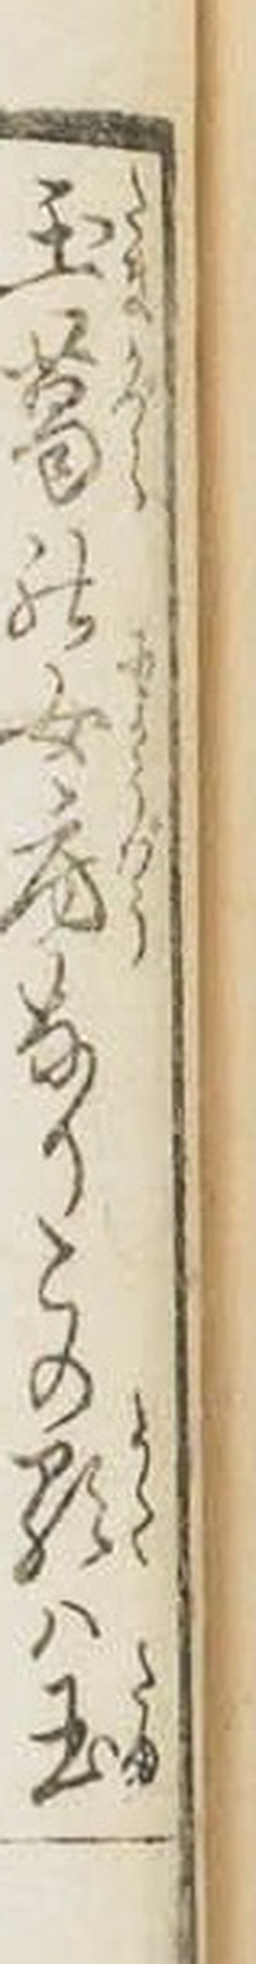玉葛の女房なりこの歌は玉
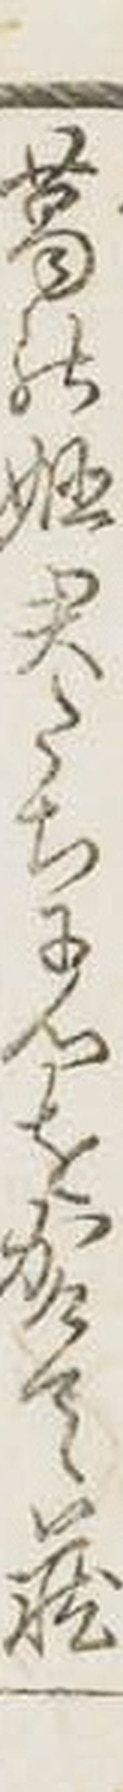葛の姫君たちに心をかけて蔵
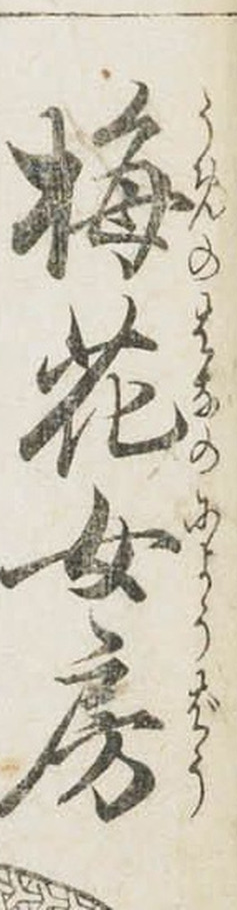梅花女房
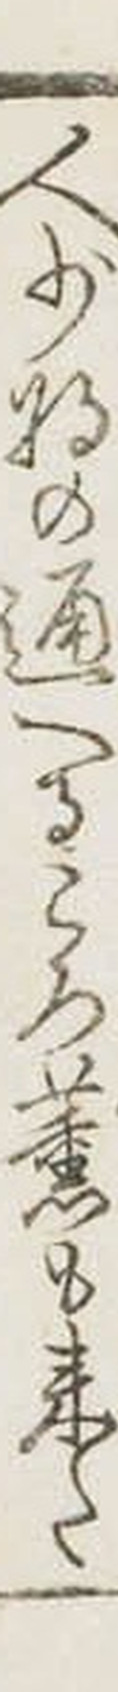人少将の通へるころ薫も来た
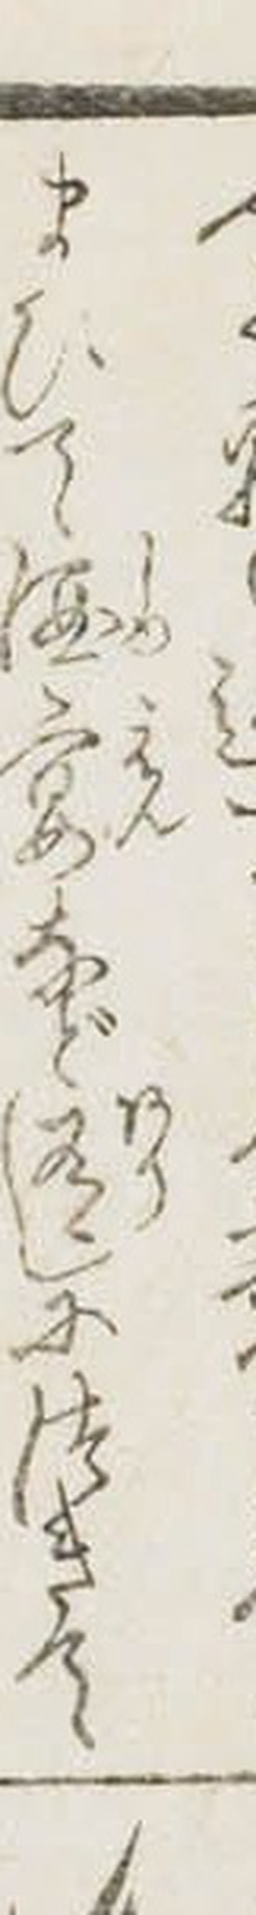まひて酒宴など有しにつきて
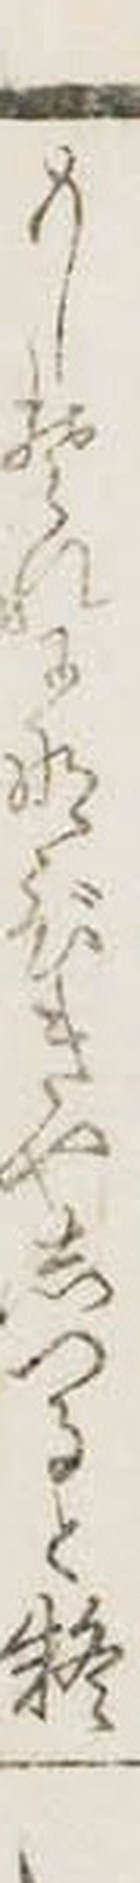もしそれになびきやしつると疑
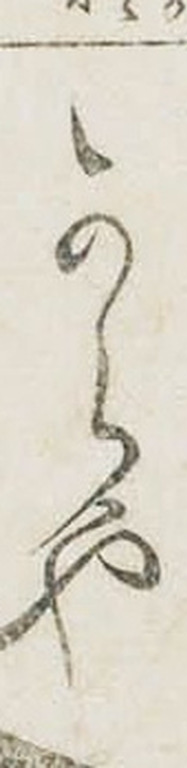からや
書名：源氏百人一首
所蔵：東京学芸大学教育コンテンツアーカイブ
